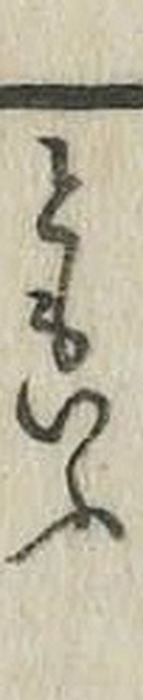ともいふ
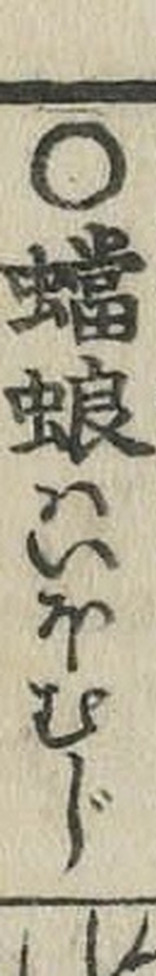○螳蜋はいほむじ

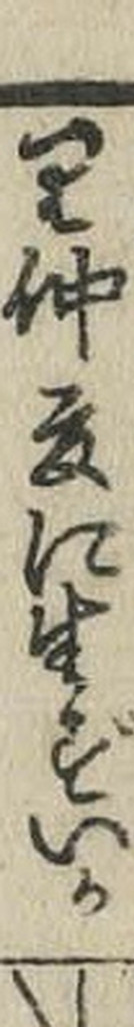り仲夏に生ずいか
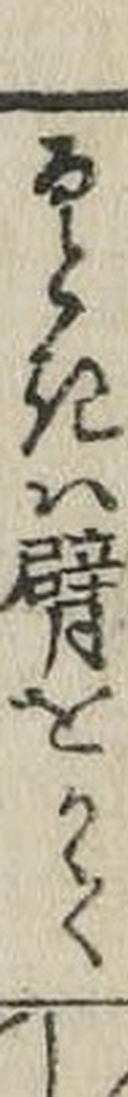るときは臂をかゝく
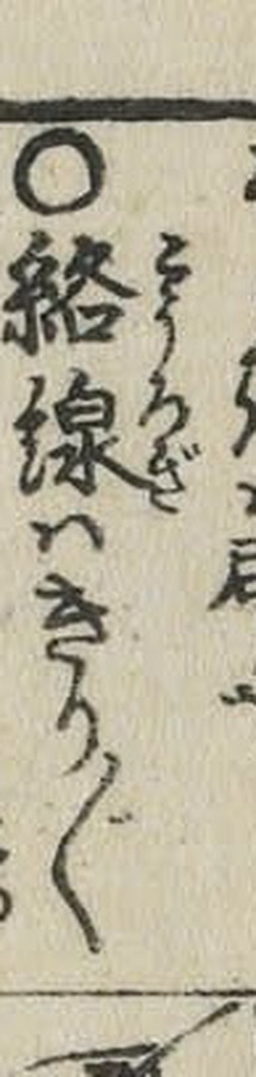○絡線はきり〴〵
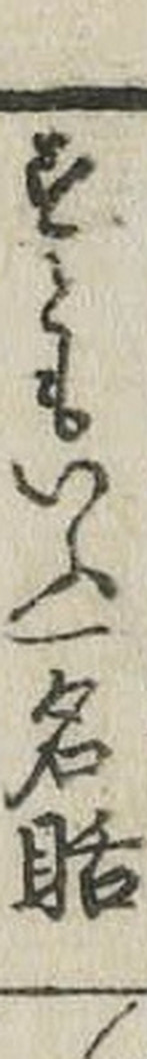すともいふ一名聒
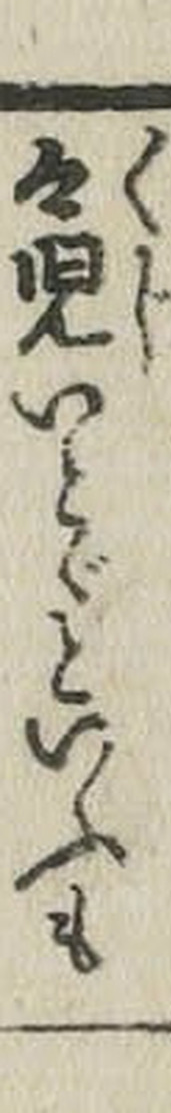々児いとゞといふも
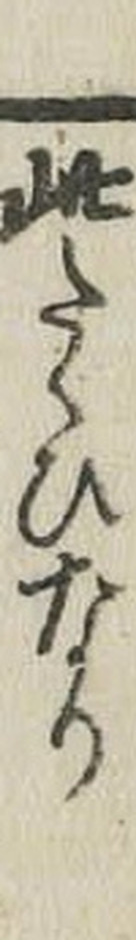此たくひなり
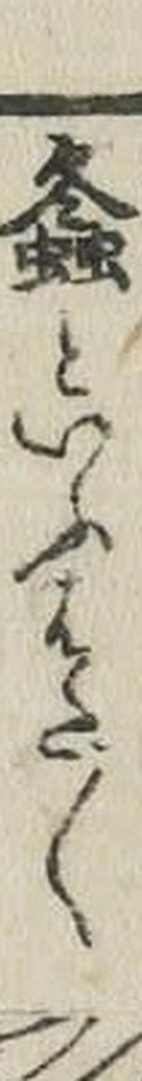螽といふはた〳〵
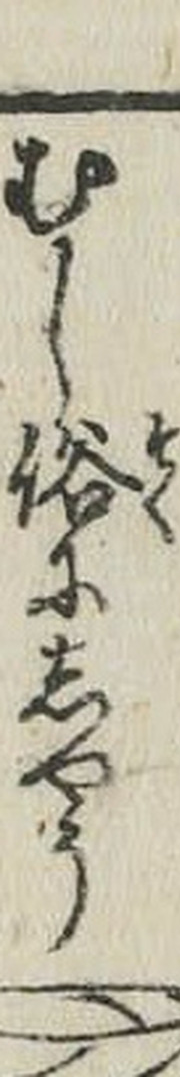むし俗にしやう
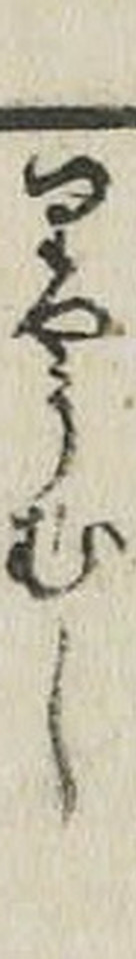りやうむし
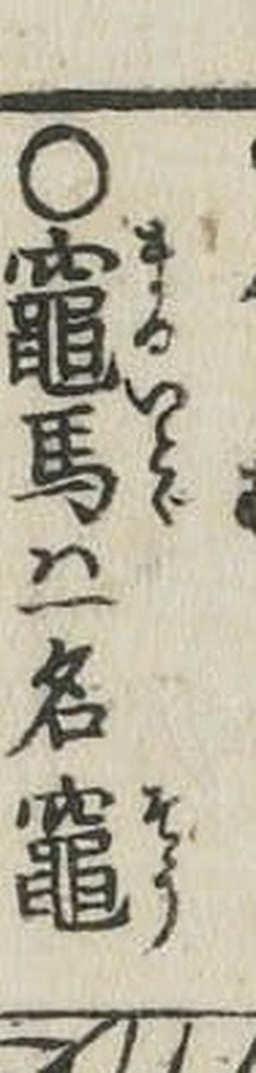○竈馬は一名竈
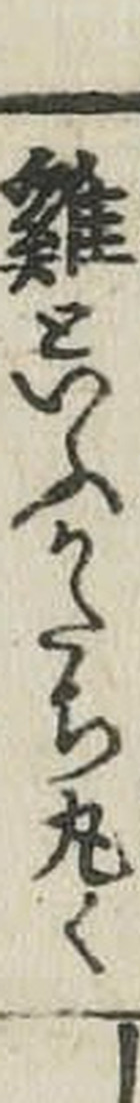雞といふかたち丸く
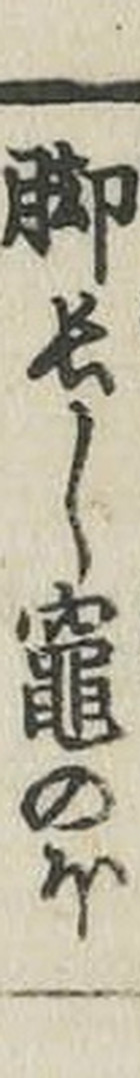脚長し竈のほ
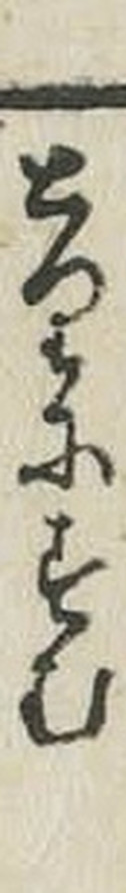とりにすむ
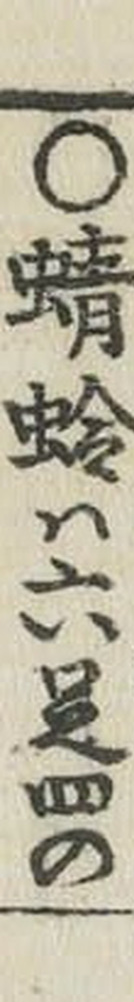○蜻蛉は六足四の
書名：増補頭書訓蒙図彙大成 10巻 7:巻之14-16
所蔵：東京学芸大学教育コンテンツアーカイブ
